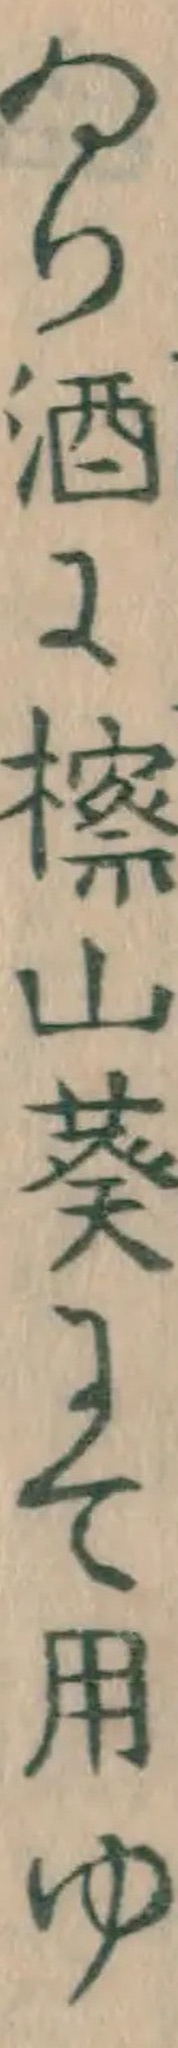ゐり酒に擦山葵にて用ゆ
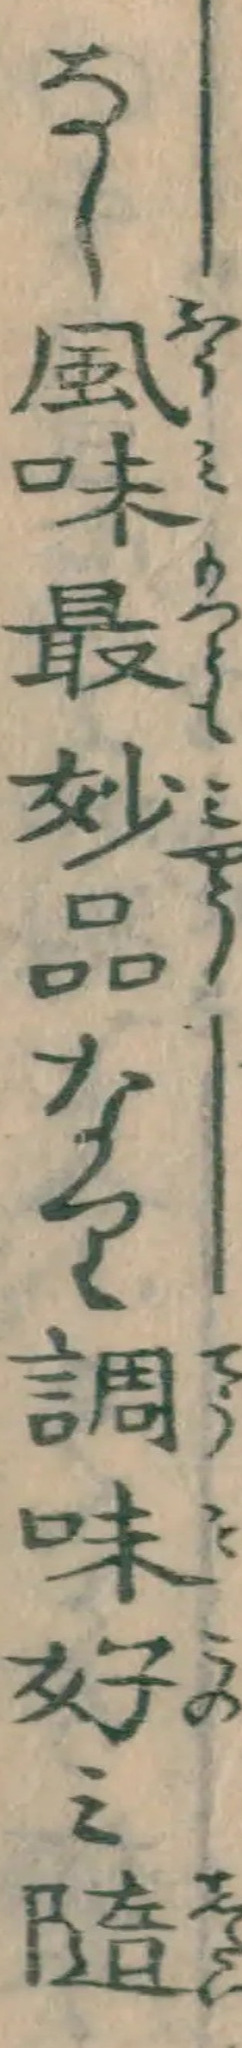なし風味最妙品なり調味好み随

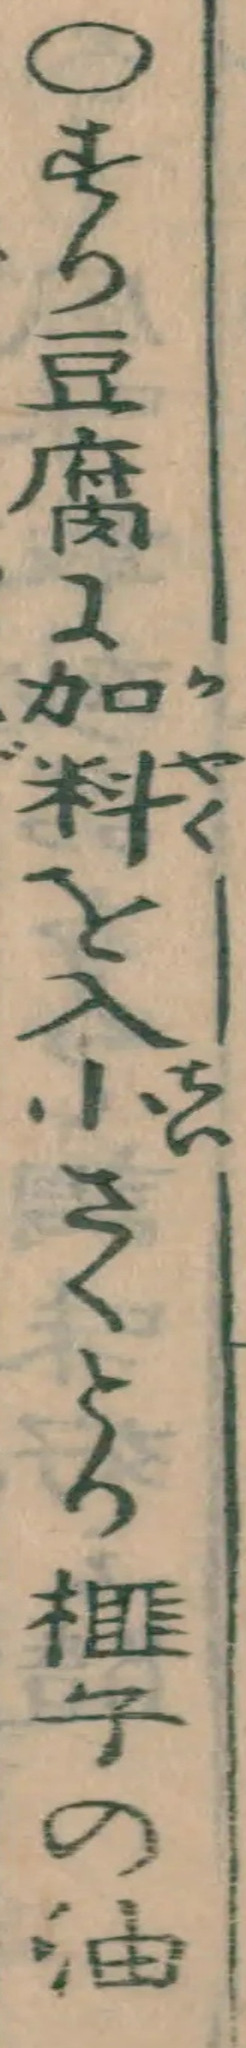○すり豆腐に加料を入小さくとり榧子の油
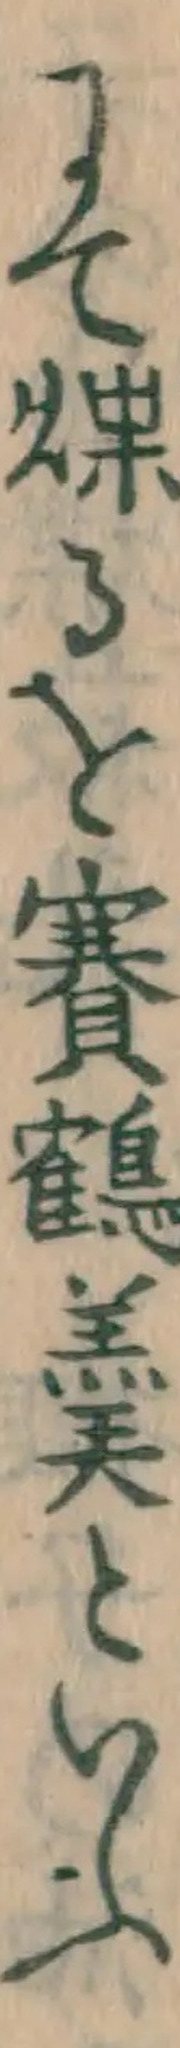にて煠るを賽鶴羹といふ
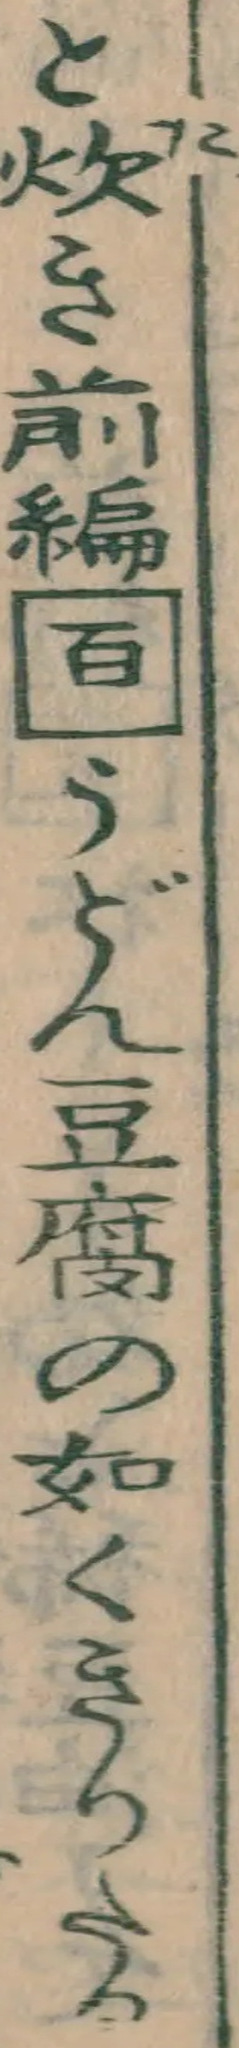と炊き前編百うどん豆腐の如くきりたる
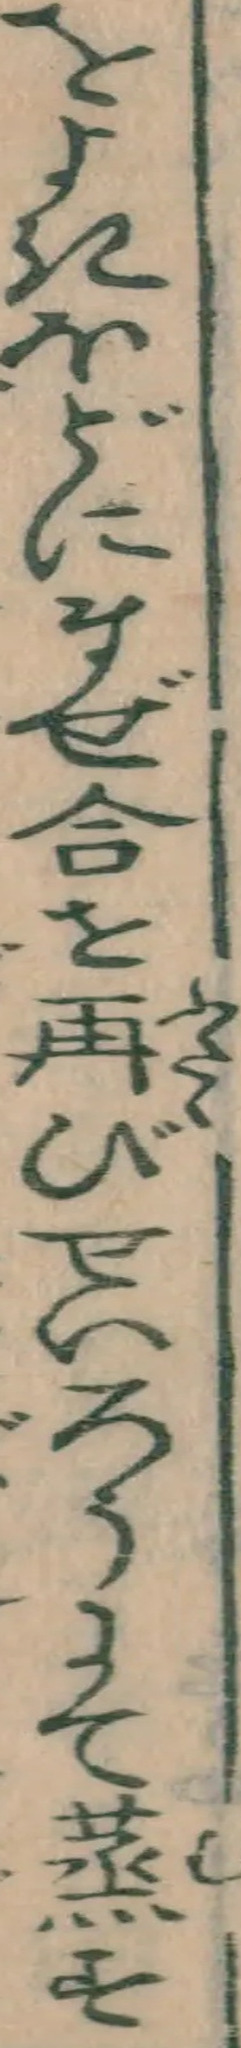をよきほどにまぜ合せ再びせいろうにて蒸す
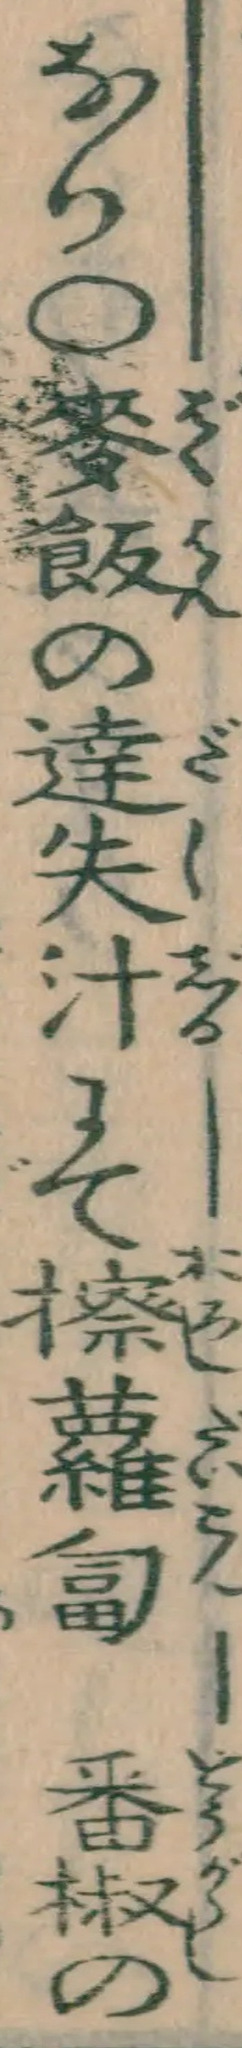なり○麦飯の達失汁にて擦蘿蔔番椒の
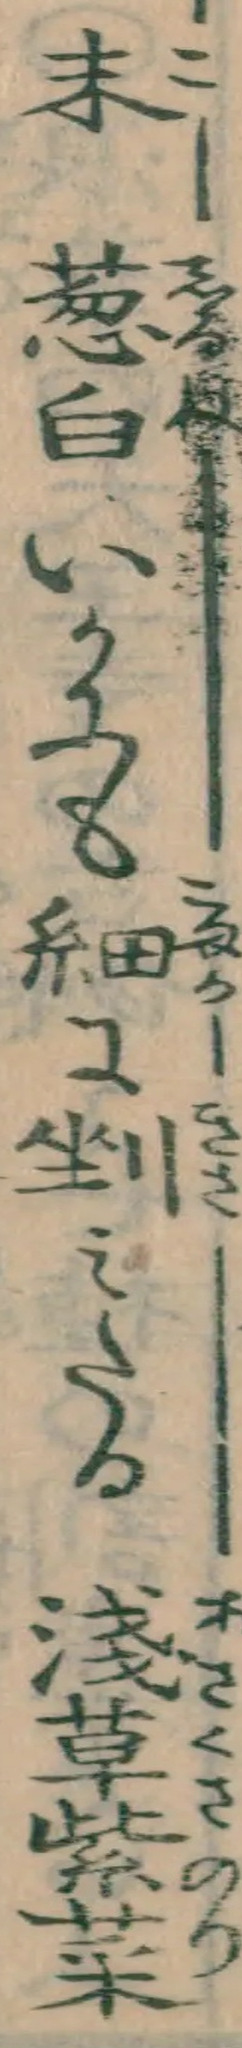末葱白いかにも細に剉みたる浅草紫菜
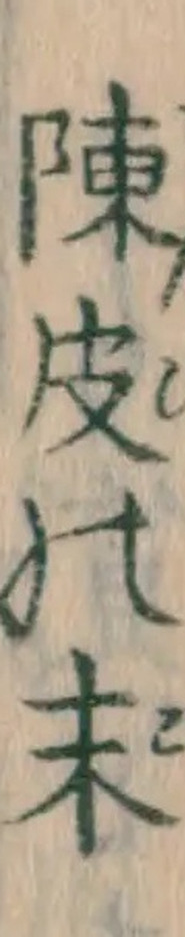陳皮の末
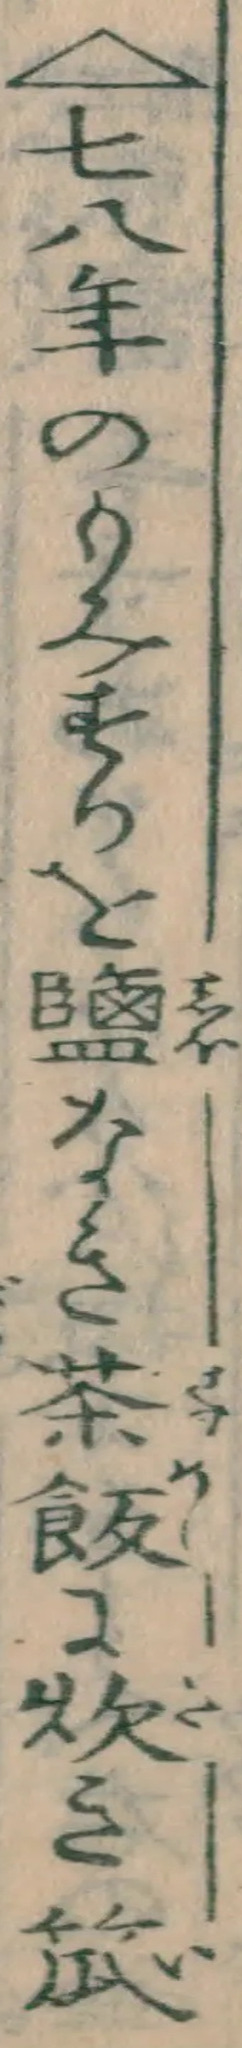△七八年のもみすりを塩なき茶飯に炊き笊
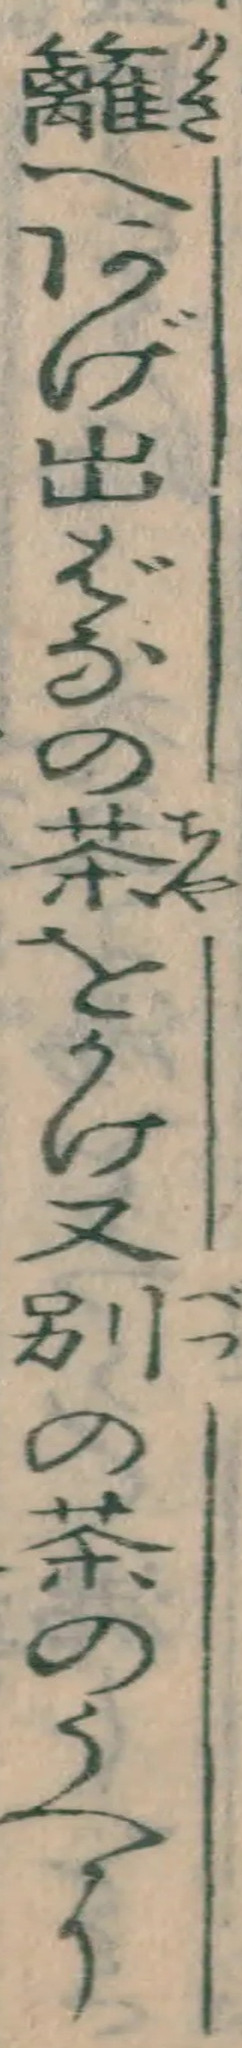籬へあげ出ばなの茶をかけ又別の茶のうへに
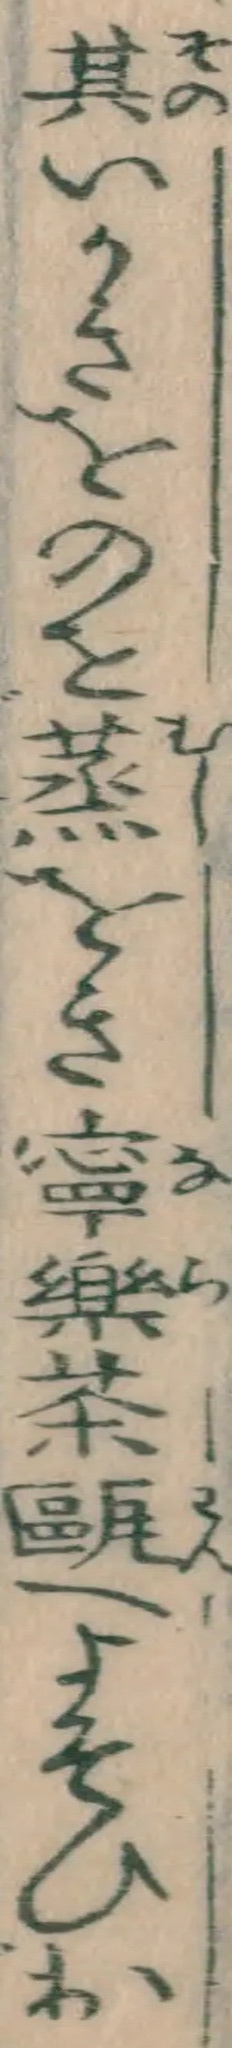其いかきをのせ蒸をき寧楽茶甌へよそひお
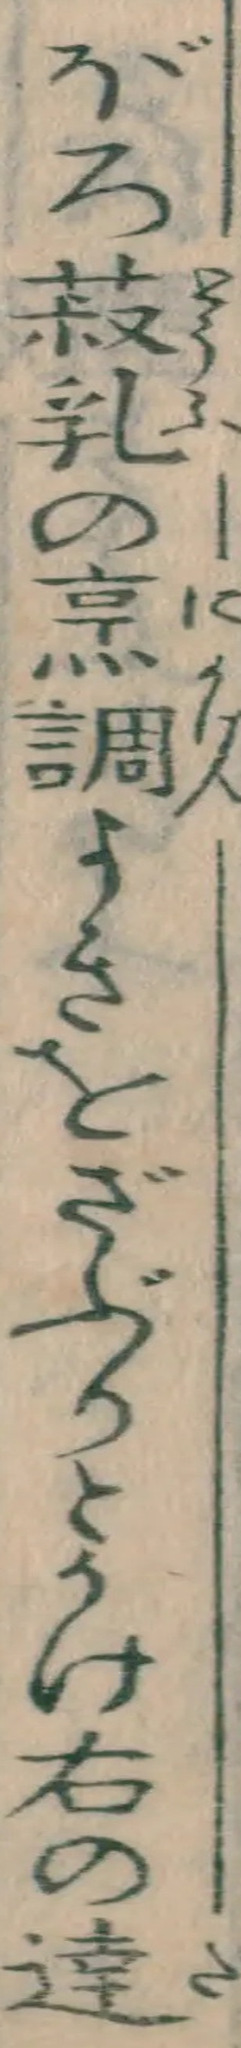ぼろ菽乳の烹調よきをざぶりとかけ右の達
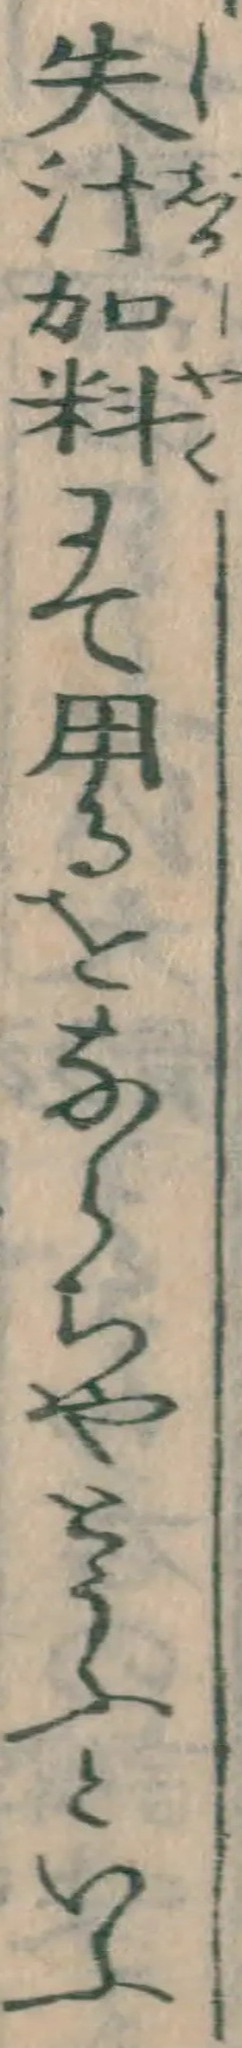失汁加料にて用るをならちやとうふといふ
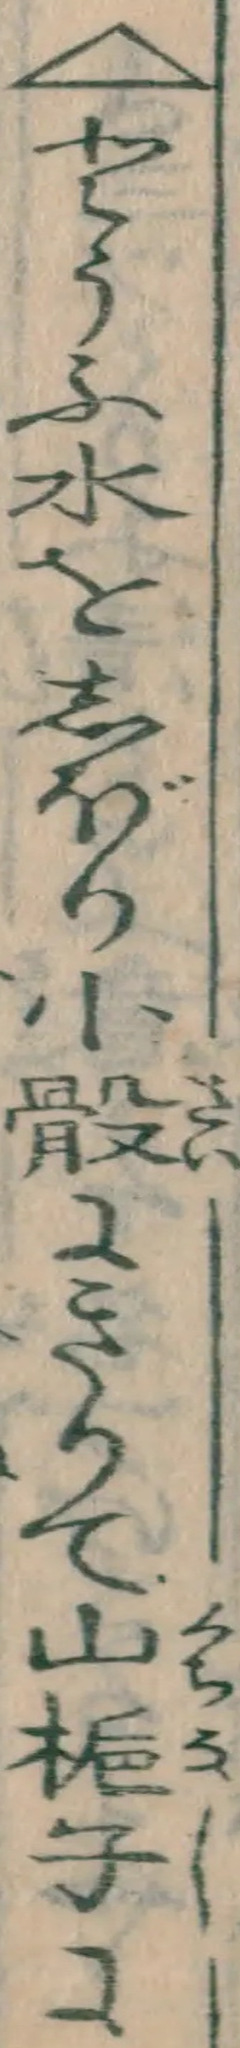△とうふ水をしぼり小骰にきりて山梔子に
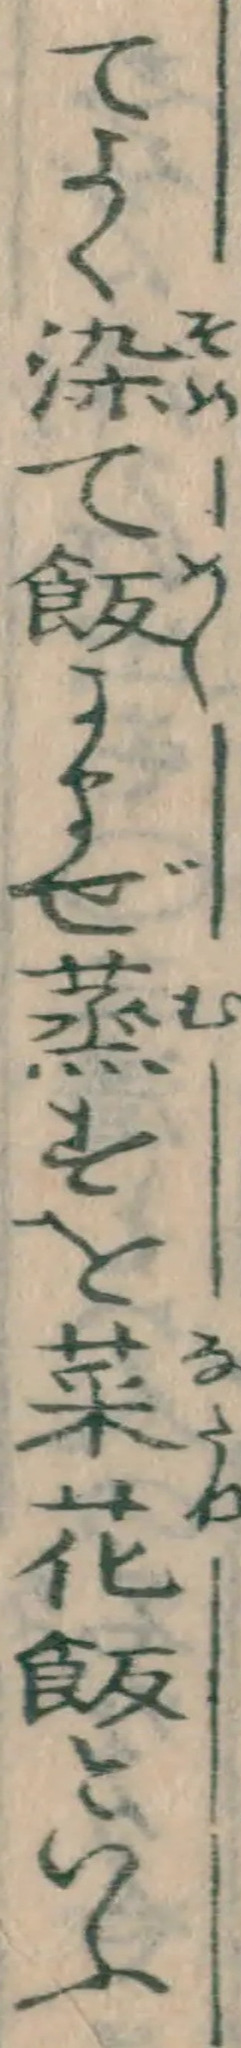てよく染て飯にまぜ蒸すを菜花飯といふ
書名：豆腐百珍. 続編
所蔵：国立国会図書館 National Diet Library, JAPAN
